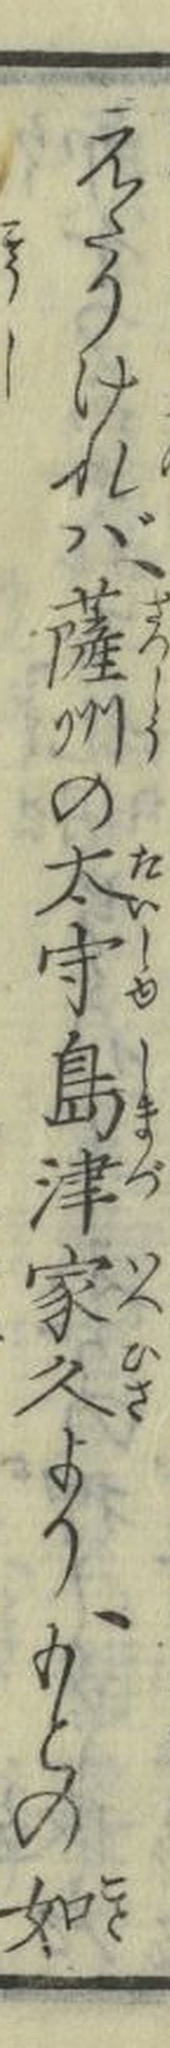えたりければ、薩州の太守島津家久より、もとの如
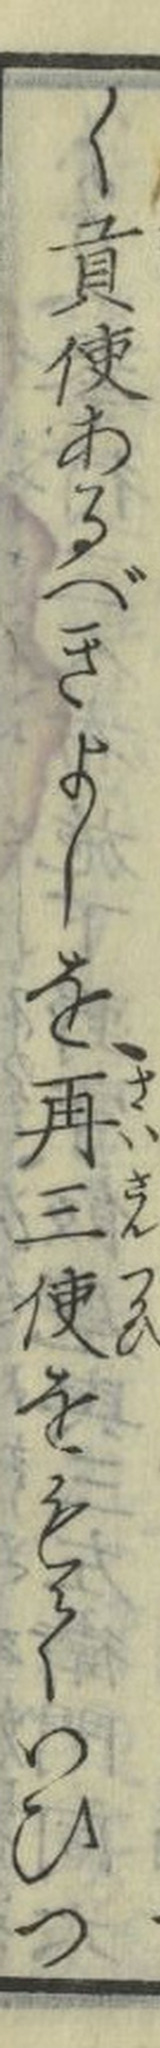く貢使あるべきよしを、再三使をもていひつ
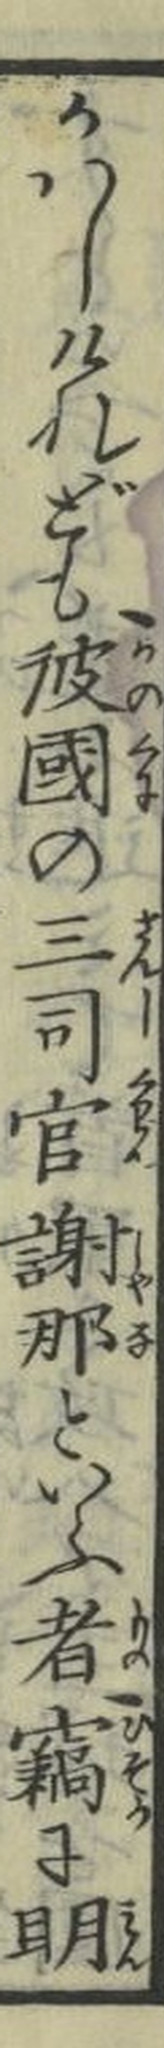かはしけれども、彼国の三司官謝那といふ者、竊に明
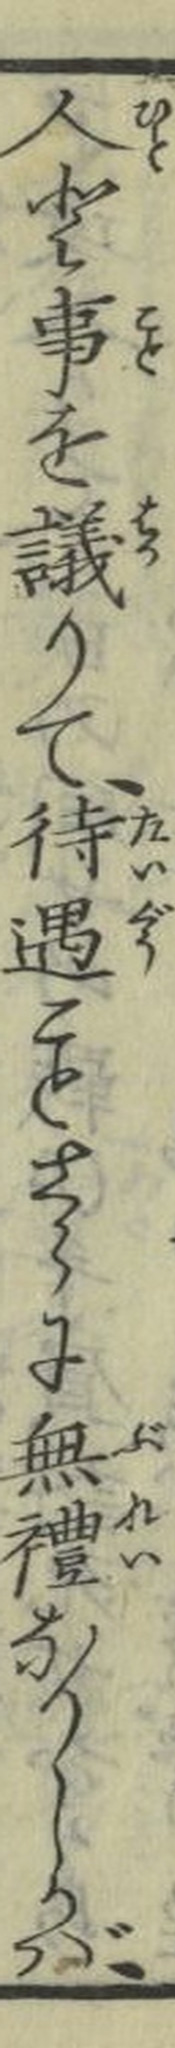人と事を議りて、待遇ことさらに無礼なりしかば、
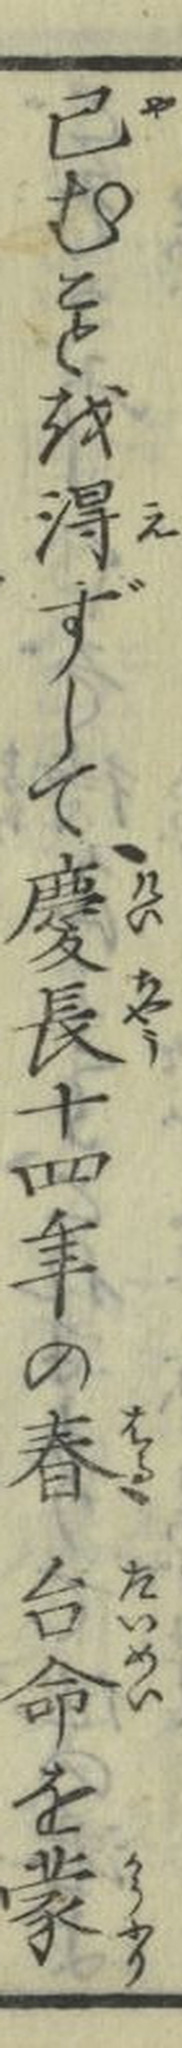已むことを得ずして、慶長十四年の春、台命を蒙
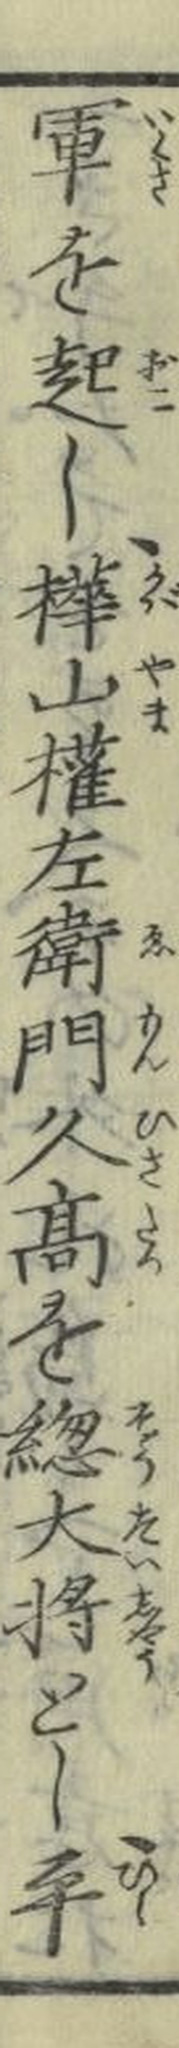軍を起し、樺山権左衛門久高を総大将とし、平
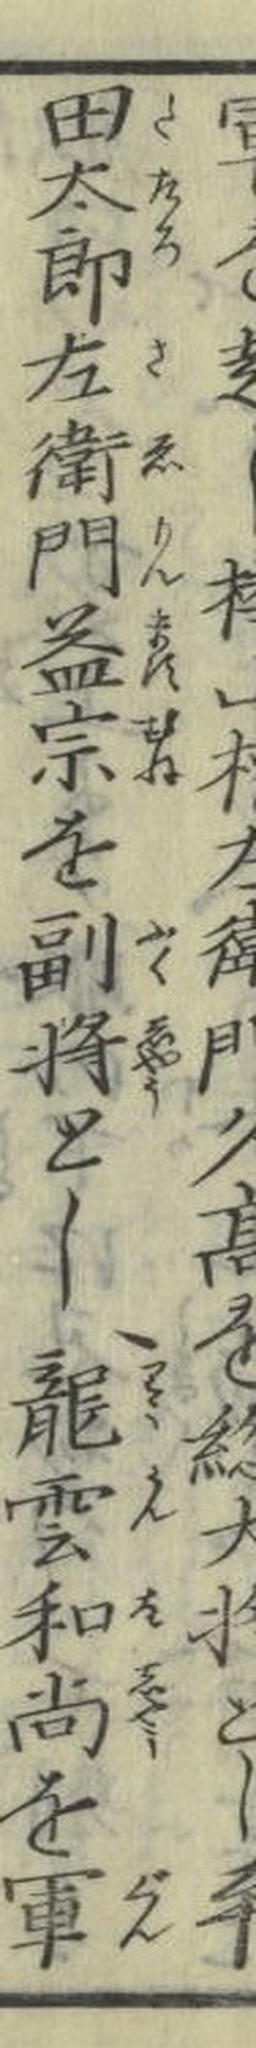田太郎左衛門益宗を副将とし、龍雲和尚を軍
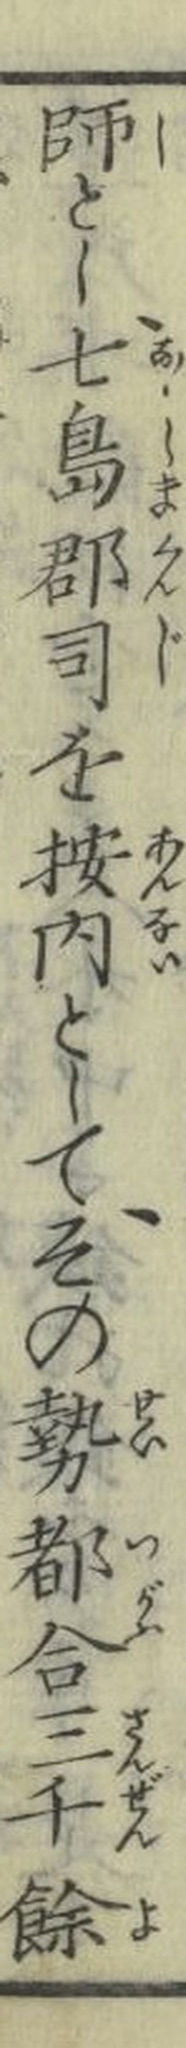師とし、七島郡司を按内として、その勢都合三千余
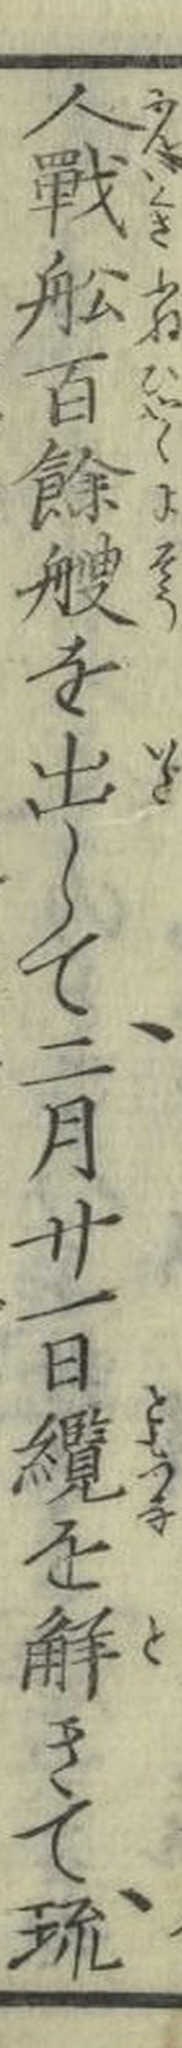人戦艦百余艘を出して、二月二十一日纜を解きて、琉
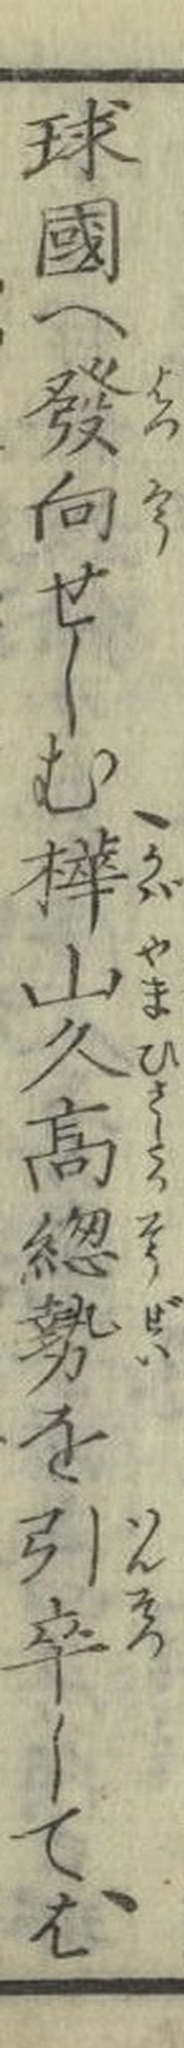球国へ発向せしむ、樺山久高総勢を引卒して、は
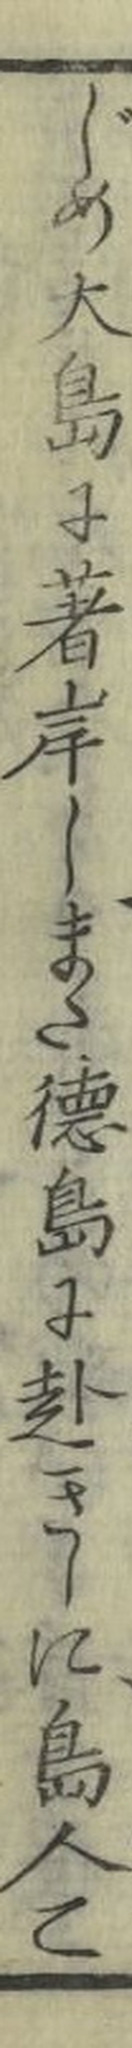じめ大島に著岸し、また徳島に赴きしに、島人こ

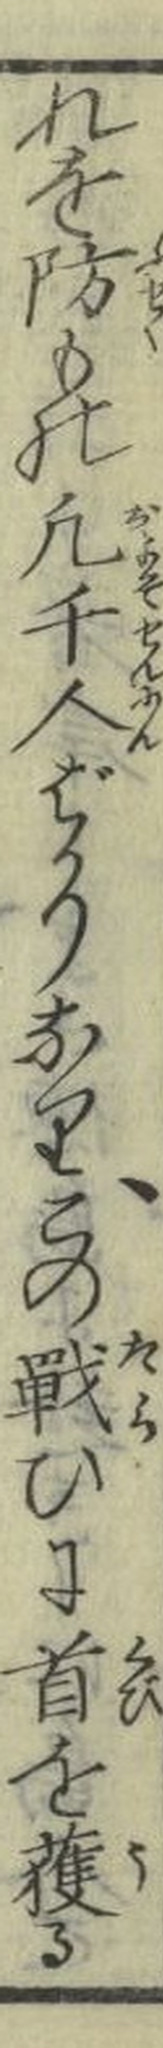れを防もの凡千人ばかりなり、この戦ひに首を獲る
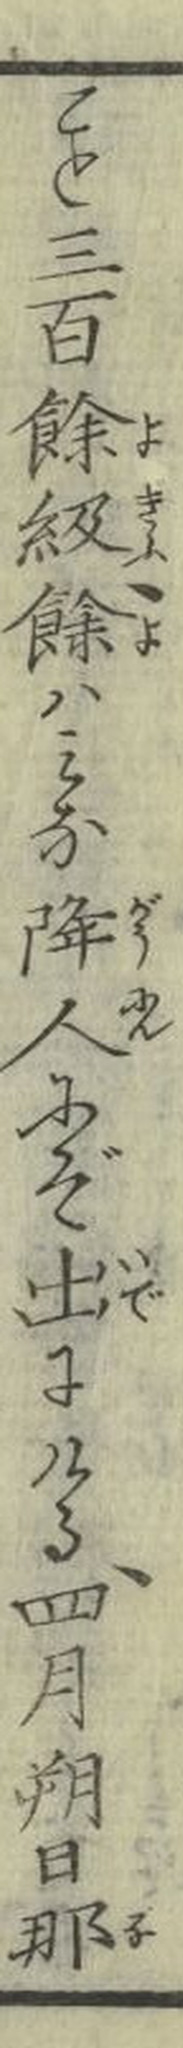こと三百余級、余はみな降人にぞ出にける、四月朔日那
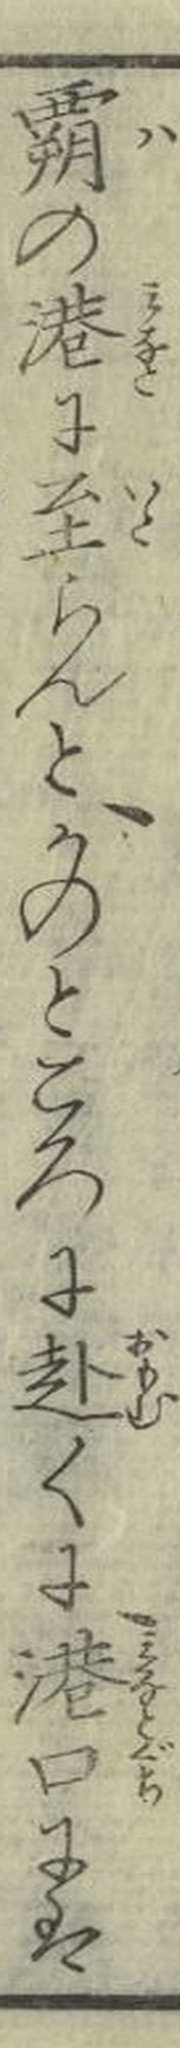覇の港に至らんと、かのところに赴くに、港口には
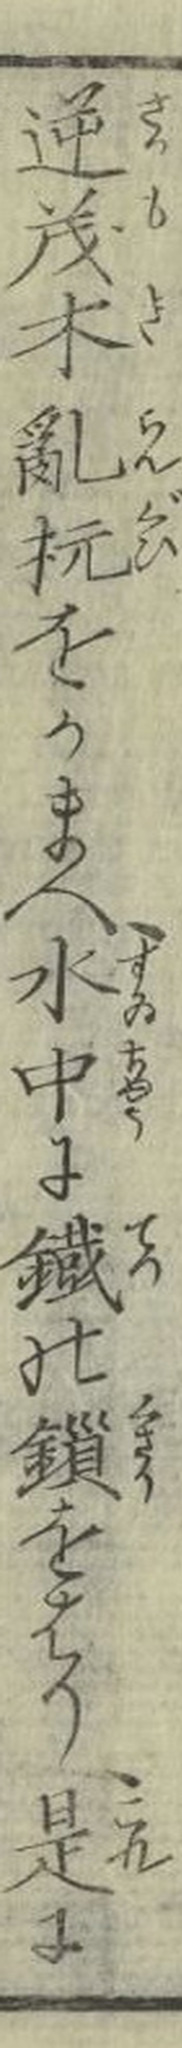逆茂木乱杭をかまへ、水中に鉄の鎖をはり、是に
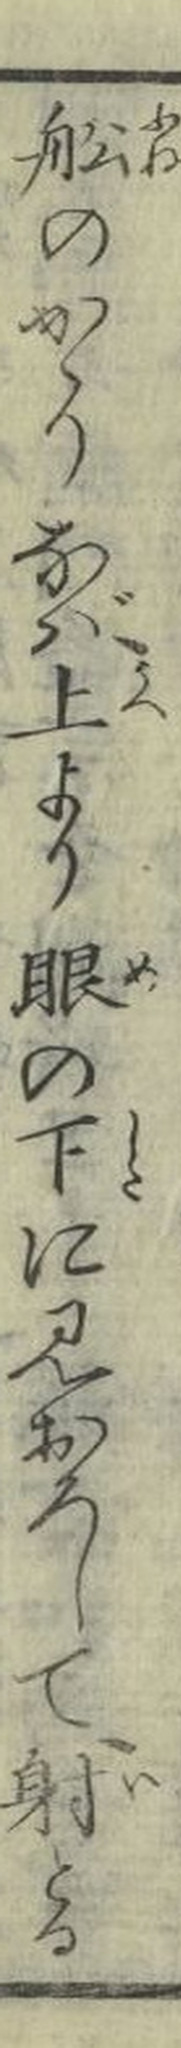船のかゝりなば、上より眼の下に見おろして、射とる
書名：琉球入貢紀畧
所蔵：University of the Ryukyus Library
